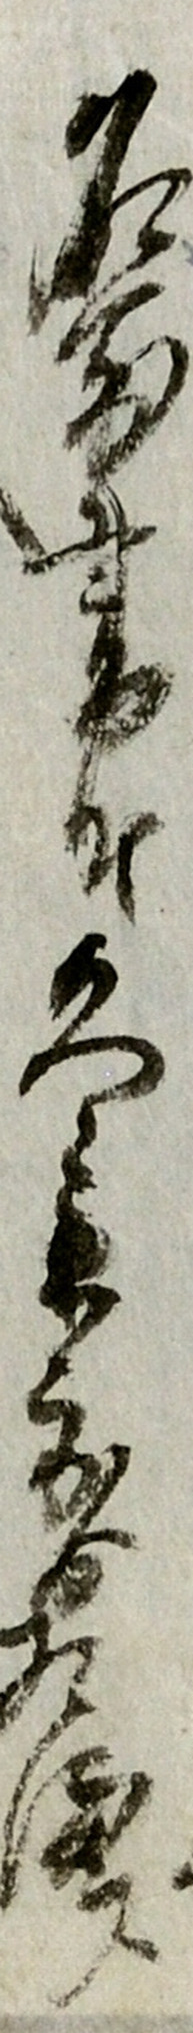名前書付久兵衛方ゟ相渡ス
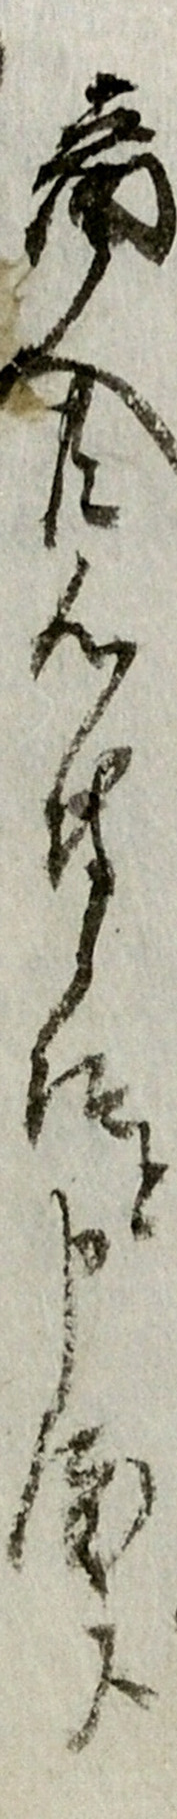商人共心付候様と申渡ス
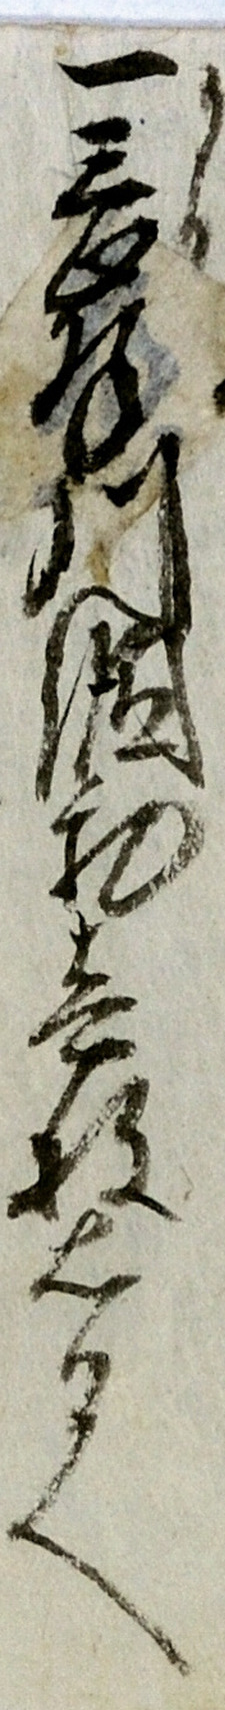一三袋川網札壱枚右同人
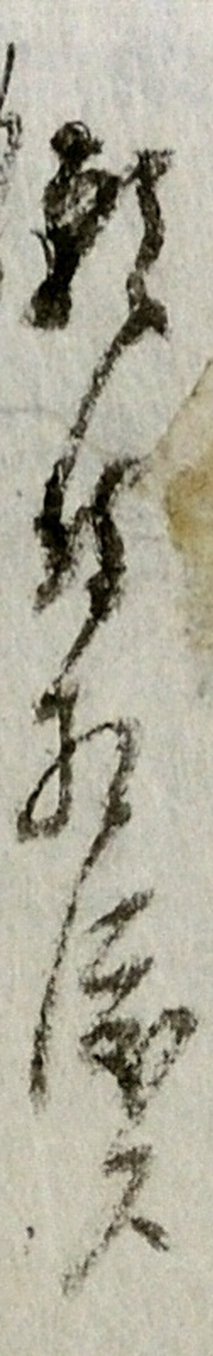預付相渡ス
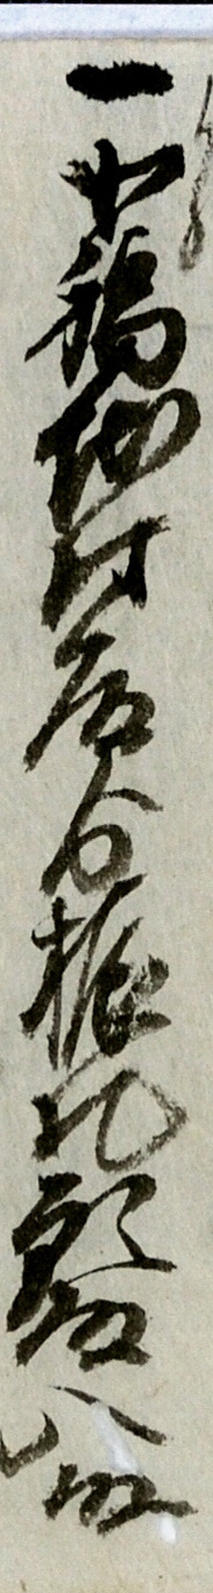一北福地村殿ゟ振札願藤八殿
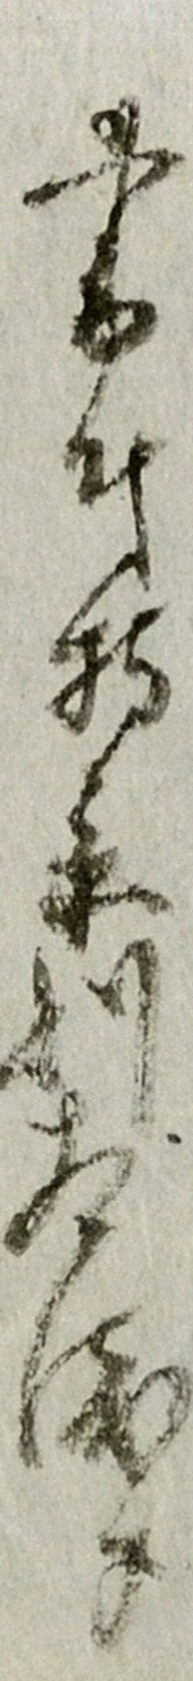書付持参則相渡候
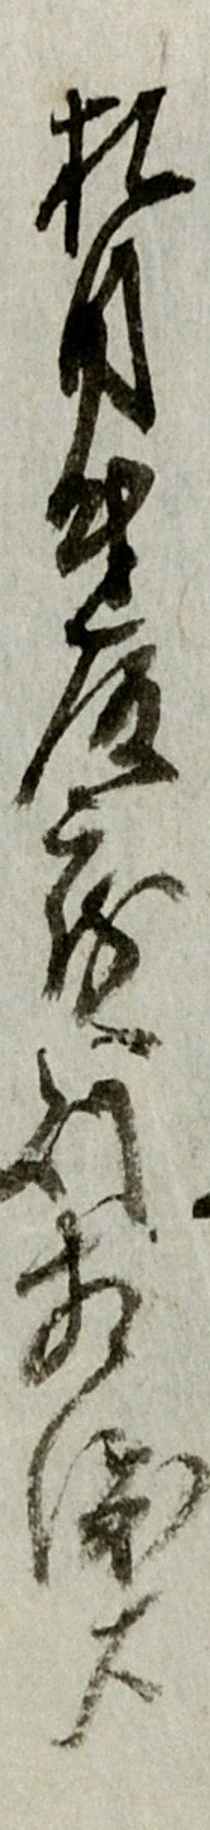札目付藤蔵則相渡ス
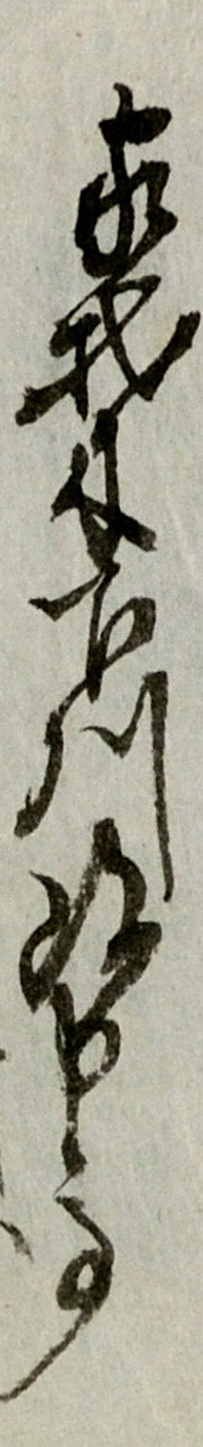家材木下川改申候事
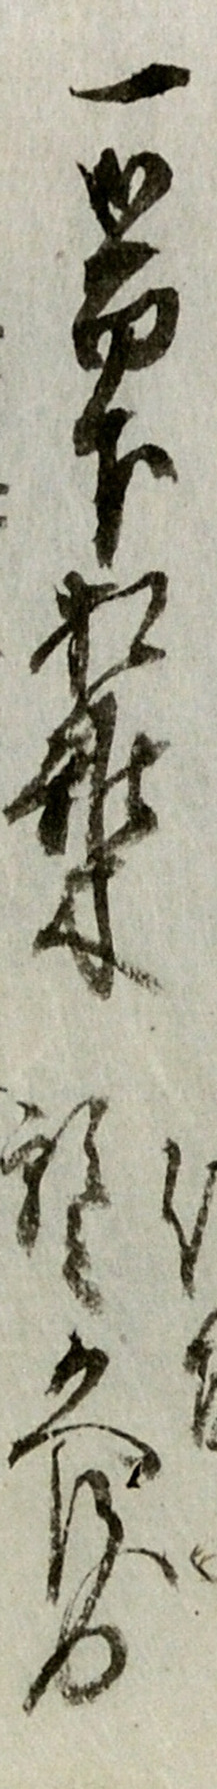一弐百本松雑木願主久左衛門
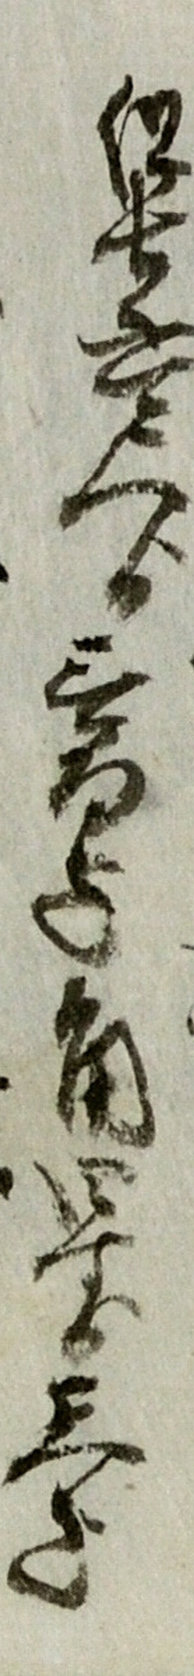但長六尺ゟ三間迄角四寸ゟ尺迄
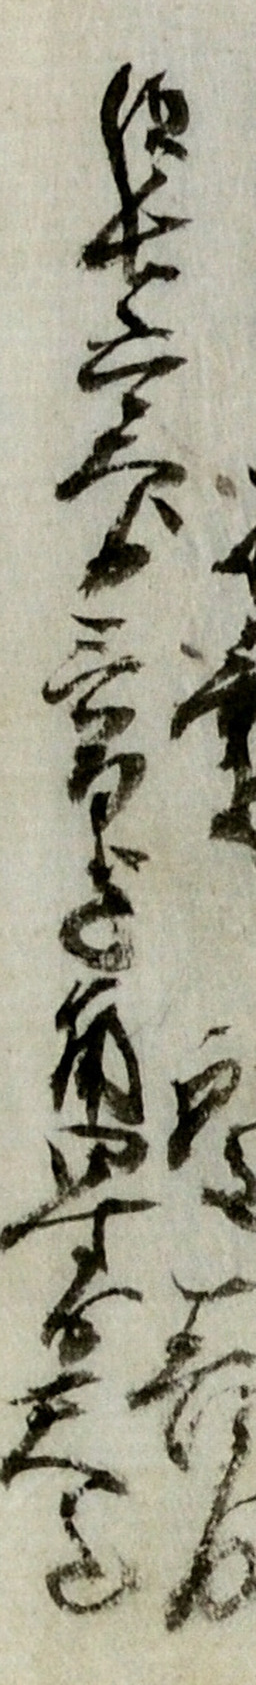但長六尺ゟ三間迄角四寸ゟ尺迄
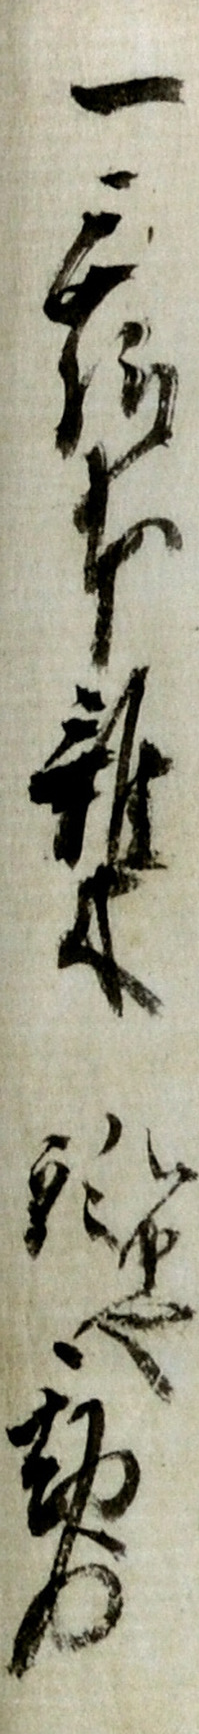一三拾本雑木願主勘右衛門

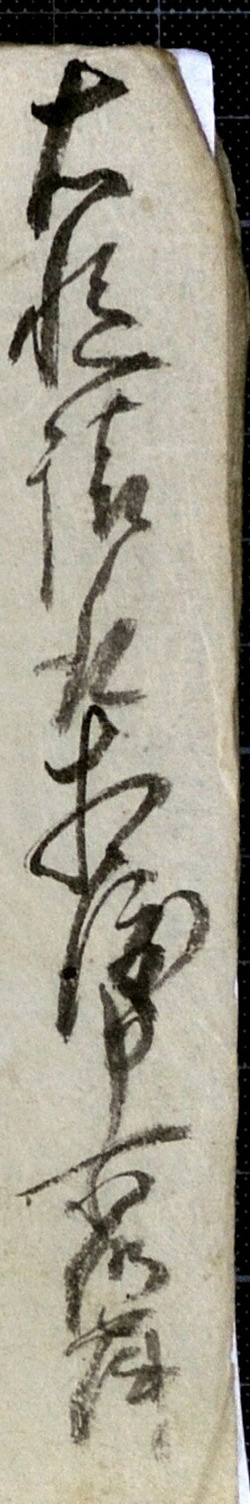右慥請取相渡申所仍如件
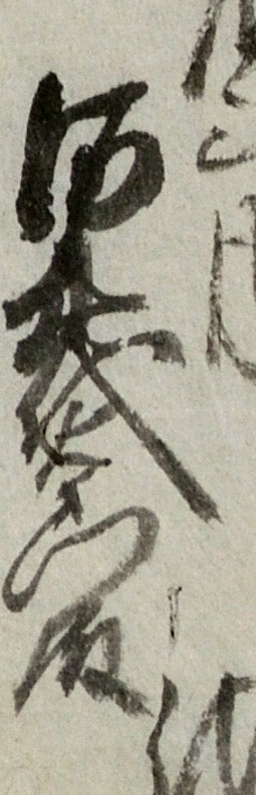酒井代右衛門殿
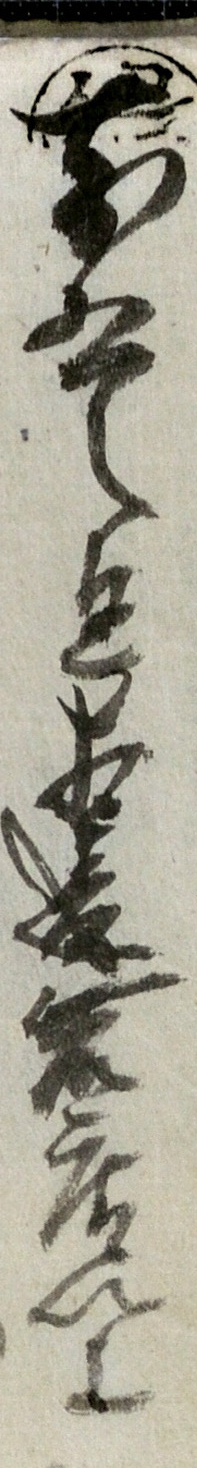前書之通相違無御座候以上
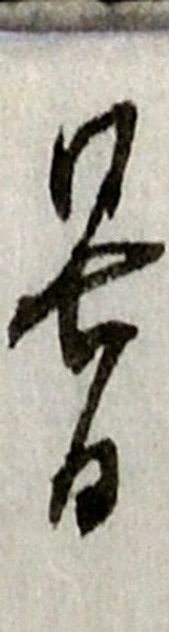同七日
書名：分一方諸事御用留帳
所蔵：伊那市立高遠町図書館・合同会社AMANE
